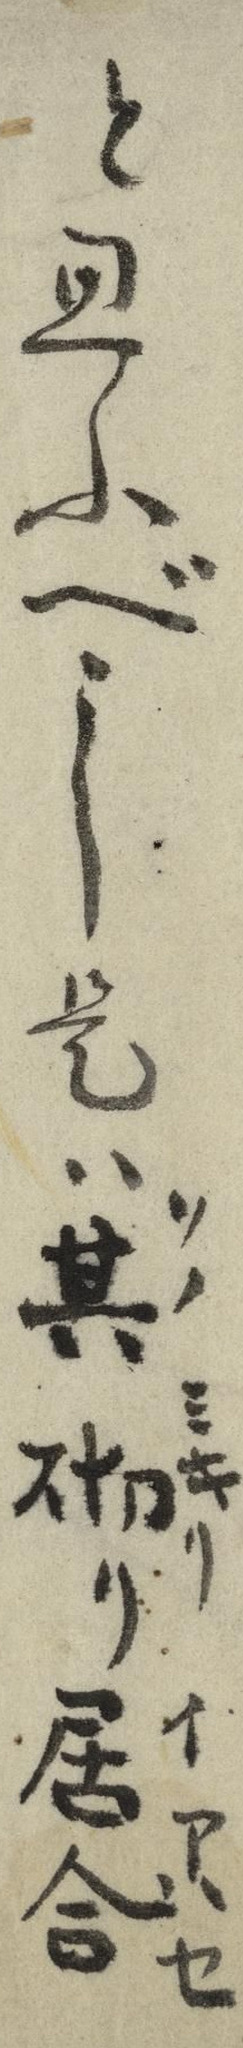と思ふべし是ハ其砌り居合
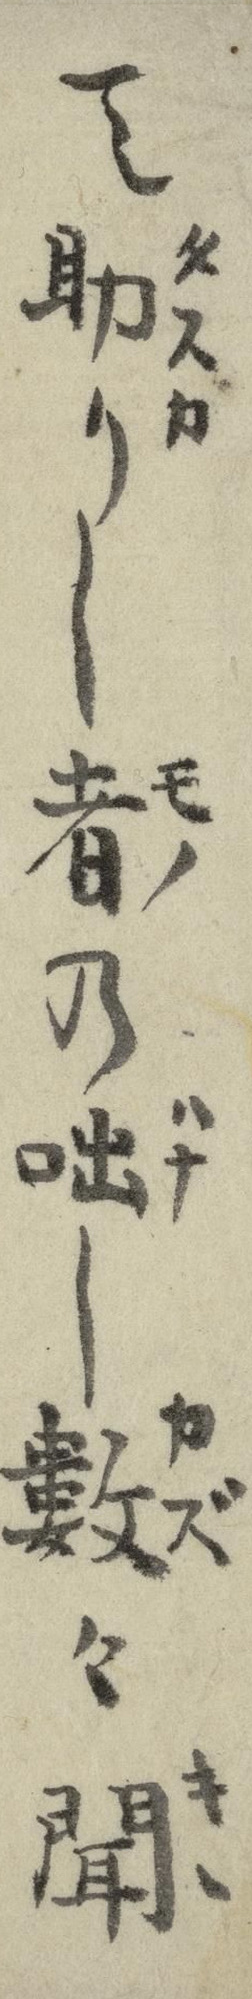て助りし者乃咄し数々聞
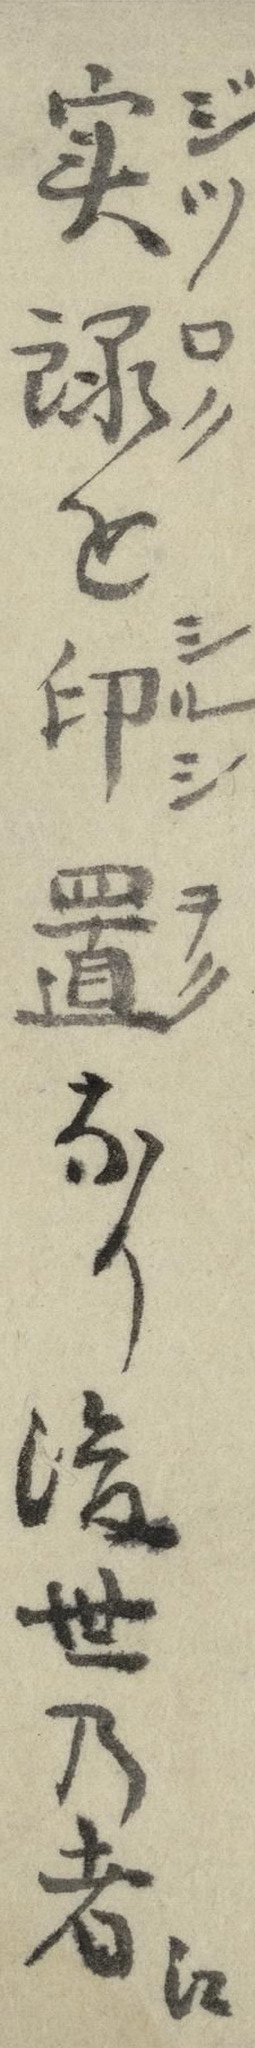実録を印置なり後世乃者え
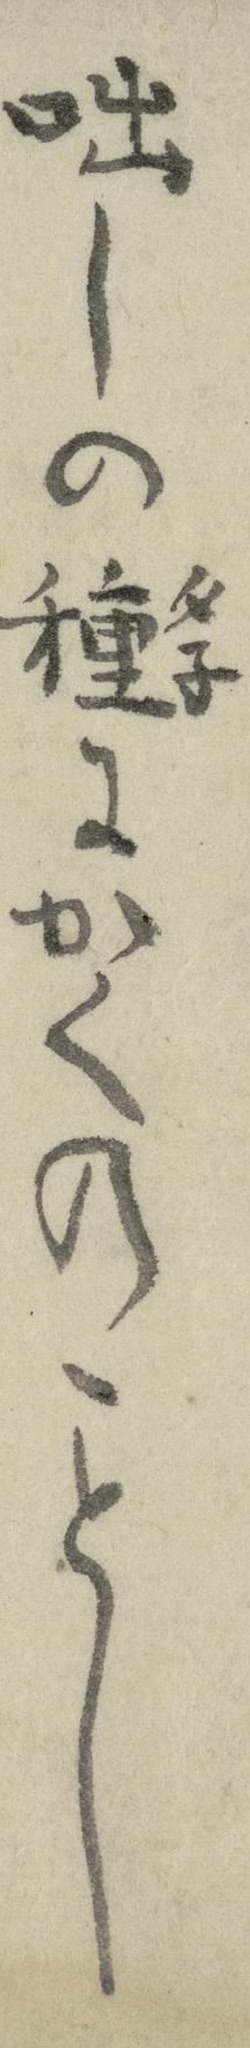話しの種にかく乃ことし
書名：信州大地震一件之冩　丁未弘化四年三月吉日
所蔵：東京大学地震研究所図書室 Earthquake Research Institute Library, The University of Tokyo, JAPAN
